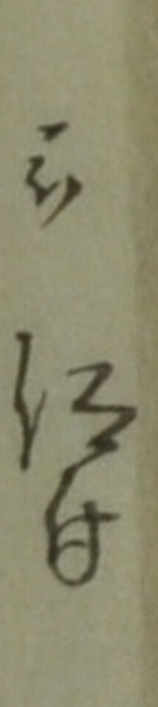被仰付
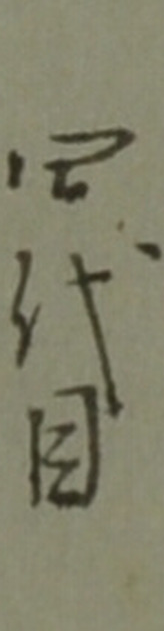四代目
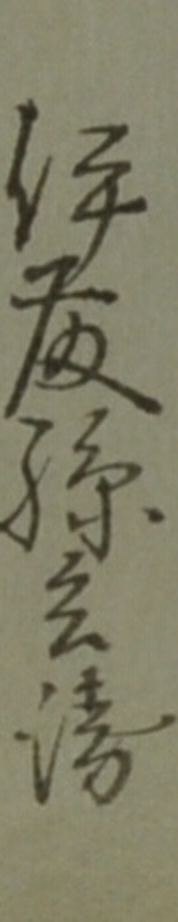伊藤孫兵衛
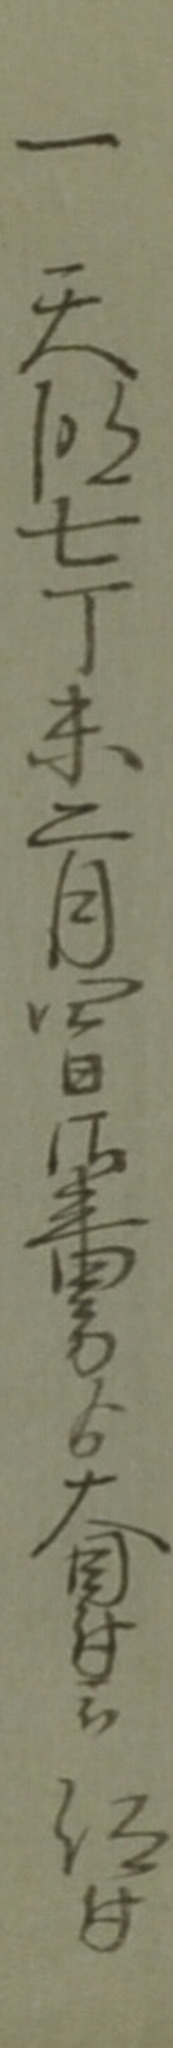一天明七丁未二月四日御番方ゟ大目付被仰付
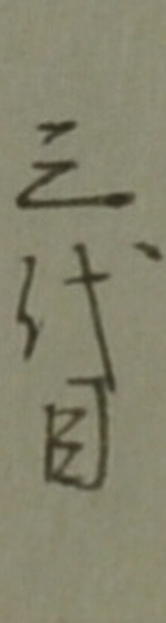三代目
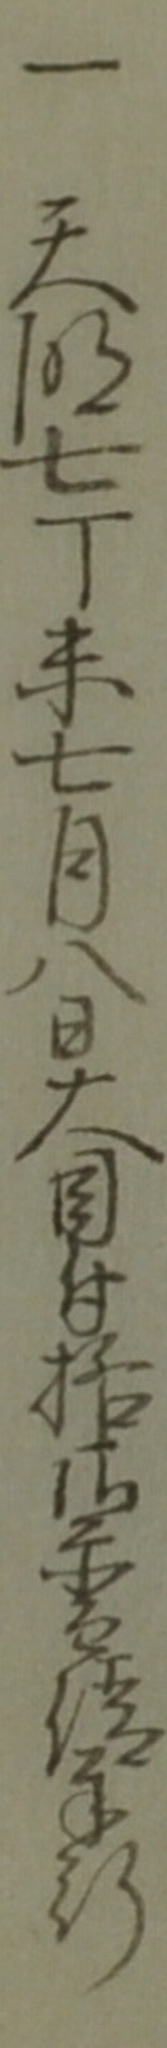一天明七丁未七月八日大目付格御普請奉行
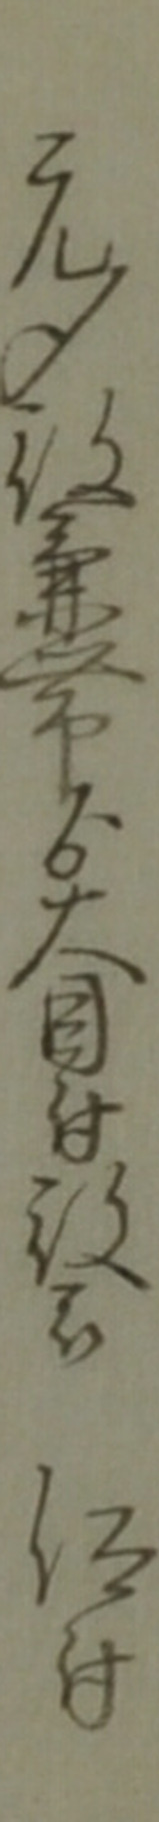元〆役兼帯ゟ大目付役被仰付
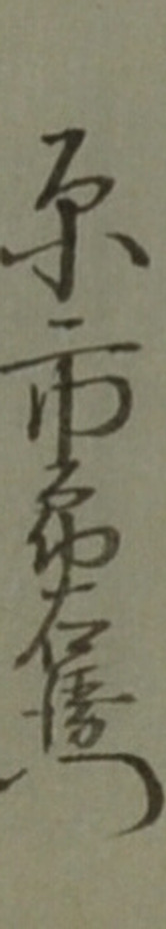原市郎右衛門
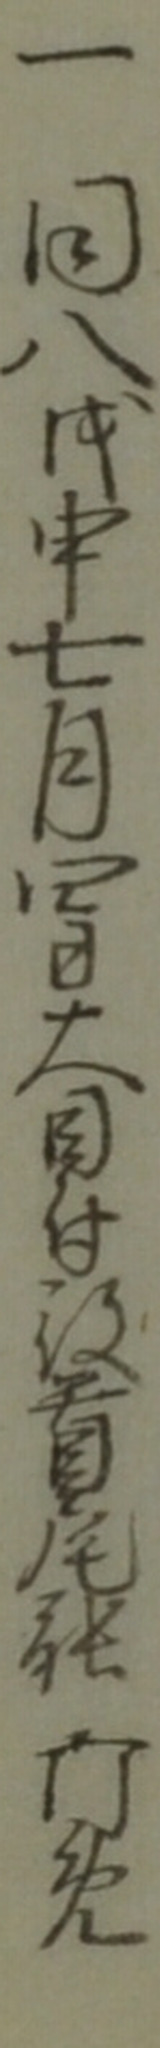一同八戊申七月四日大目付役首尾能御免
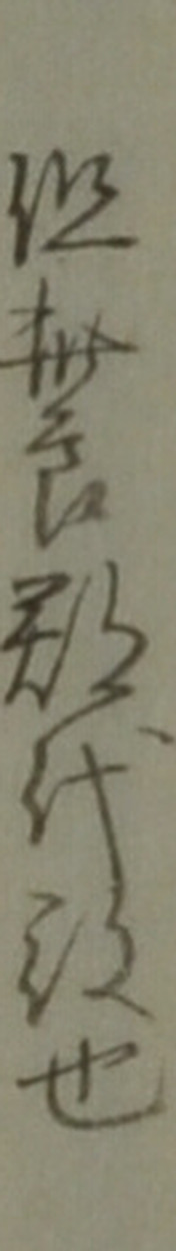但此節郡代役也
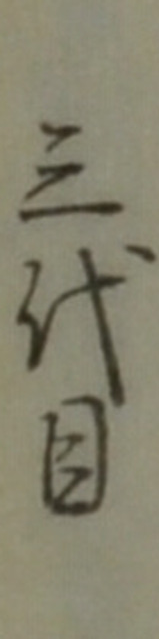三代目
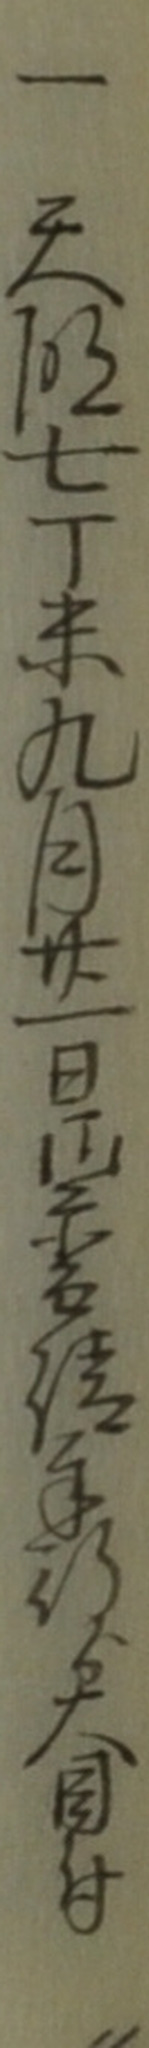一天明七丁未九月廿一日御普請奉行ゟ大目付
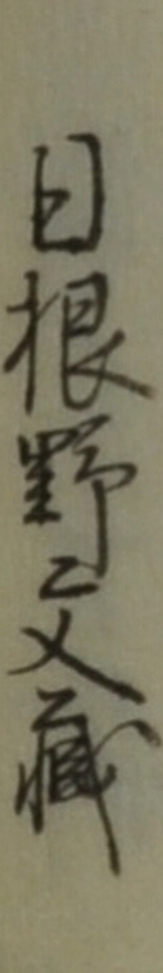日根野文蔵
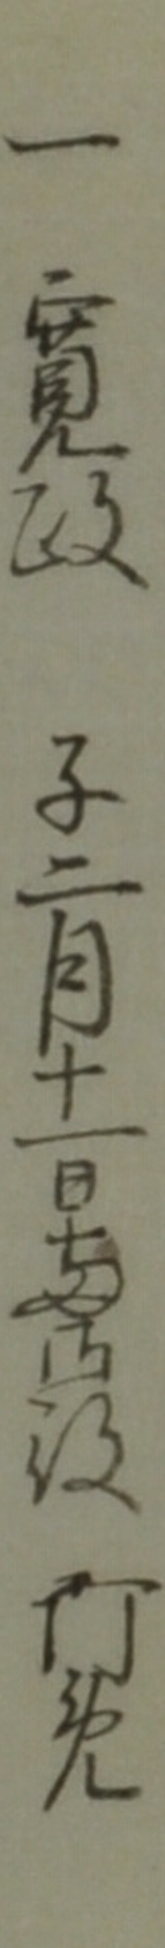一寛政子二月十一日両御役御免
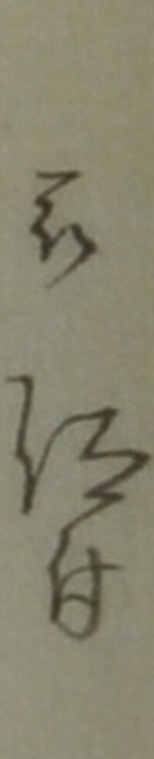被仰付
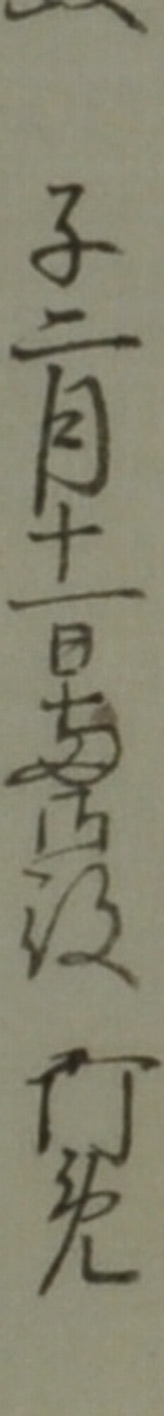一寛政子二月十一日両御役御免
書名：諸御役代々録（三）
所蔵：伊那市立高遠町図書館・合同会社AMANE
